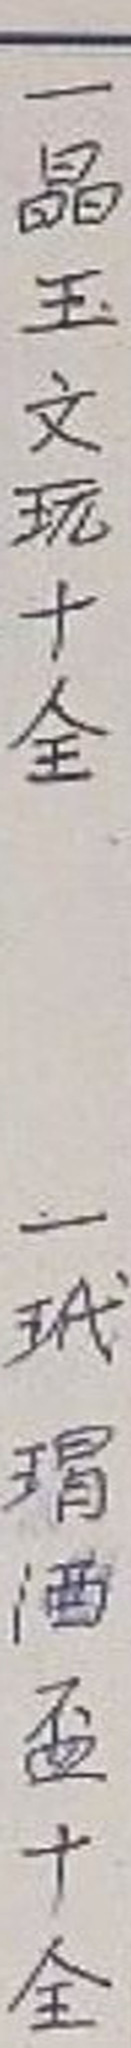一晶玉文玩十全一玳瑁酒盃十全
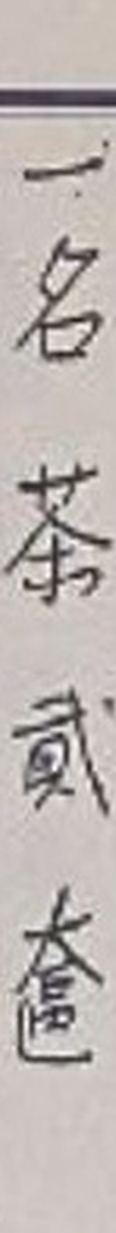一名茶弐奩一室浸弐瓶
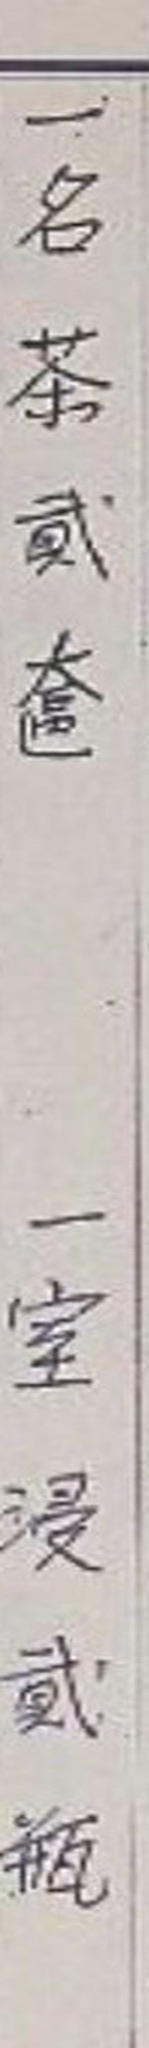一名茶弐奩一室浸弐瓶
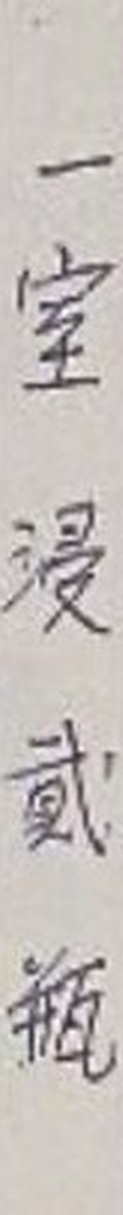一名茶弐奩一室浸弐瓶
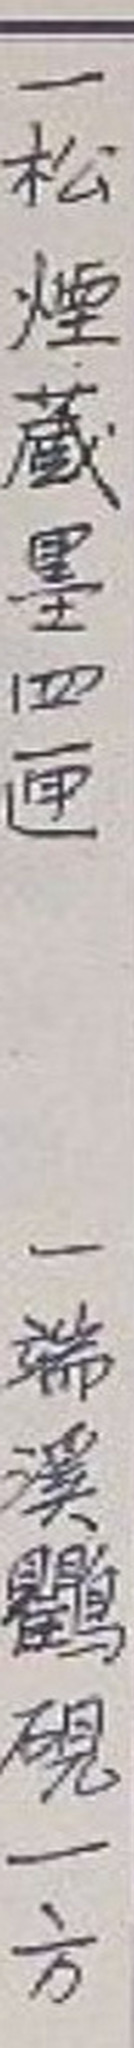一松煙蔵墨四匣一端溪鸜硯一方
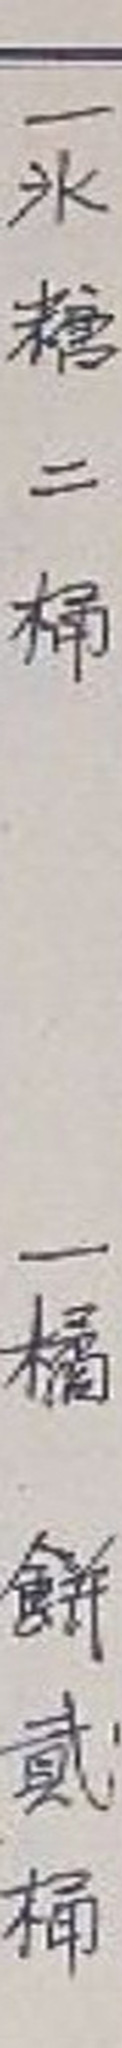一氷糖二桶一橘餅弐桶
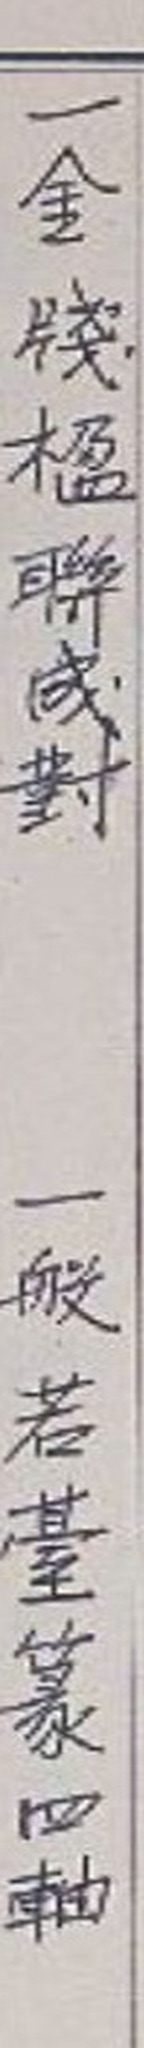一金牋楹聯成対一般若台篆四軸
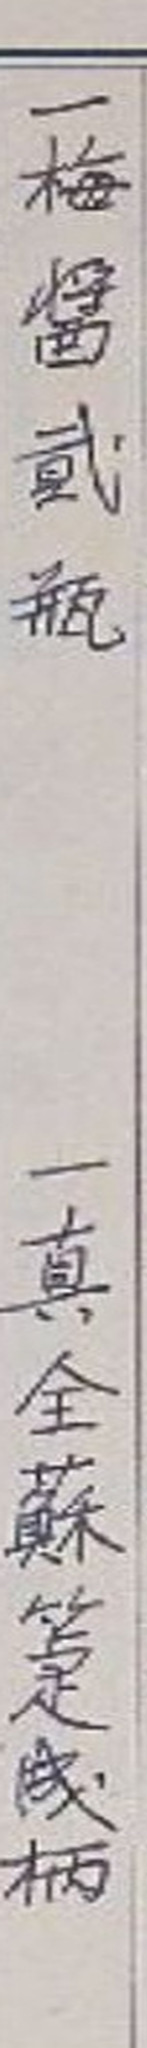一梅醤弐瓶一真全蘇箑成柄
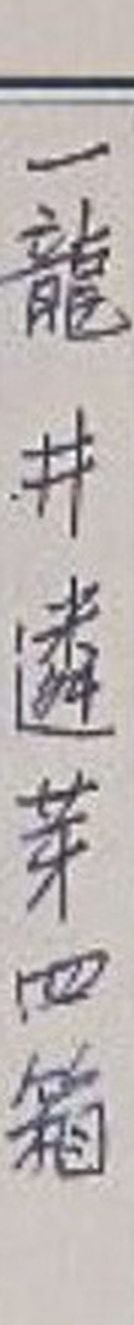一龍井遴芽四箱
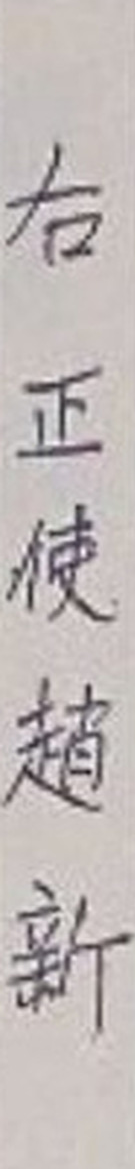右正使趙新
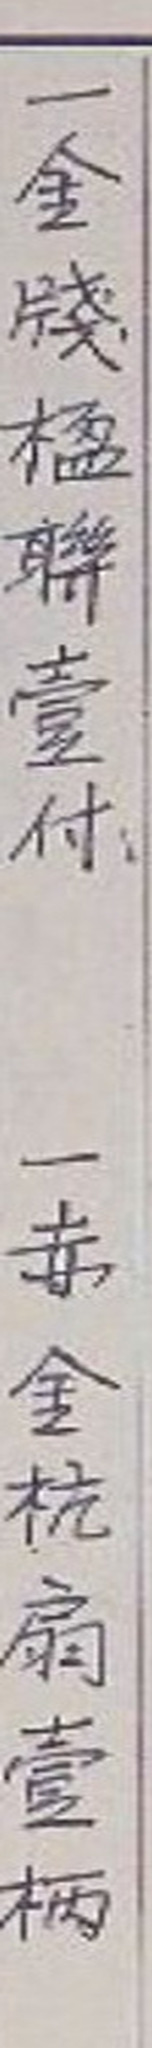一金牋楹聯壱付一赤金杭扇壱柄
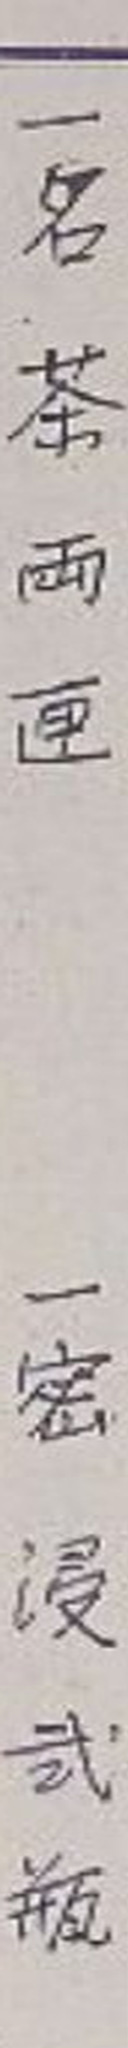一名茶両匣一密浸弐瓶
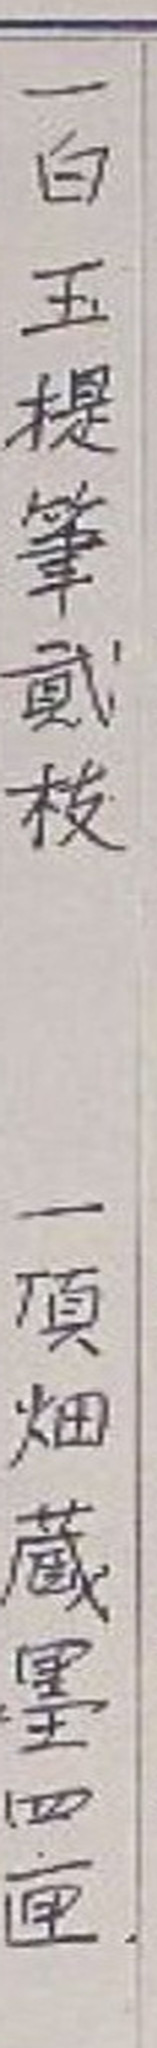一白玉提筆弐枝一頂畑蔵墨四匣
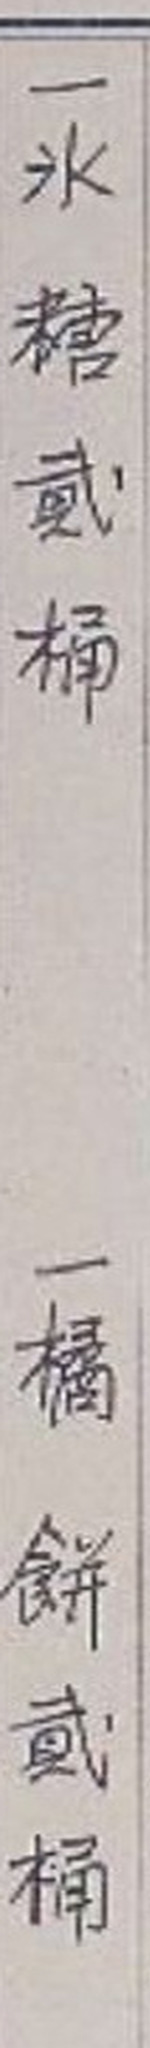一氷糖弐桶一橘餅弐桶

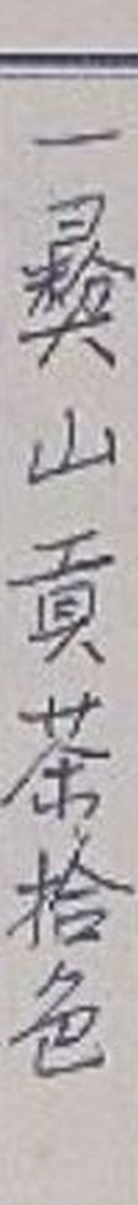一彛山貢茶拾色
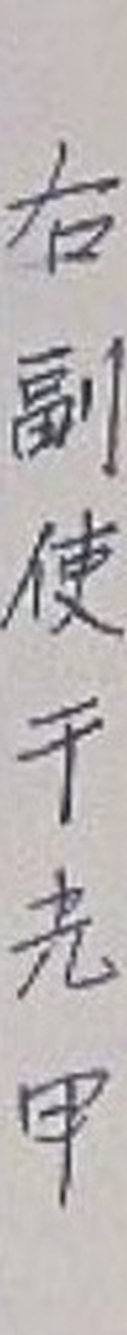右副使干光甲
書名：支那冊封使来琉諸記 下巻
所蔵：University of the Ryukyus Library
